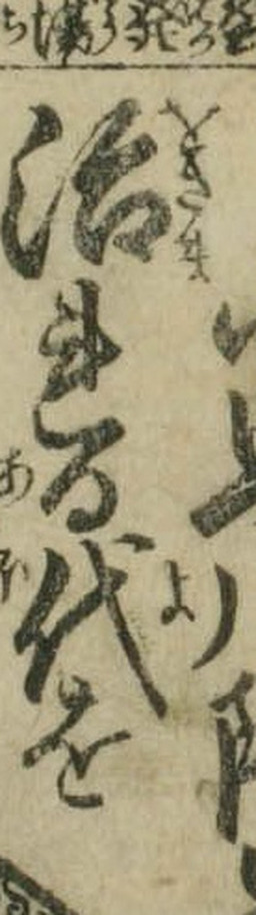治れる代を
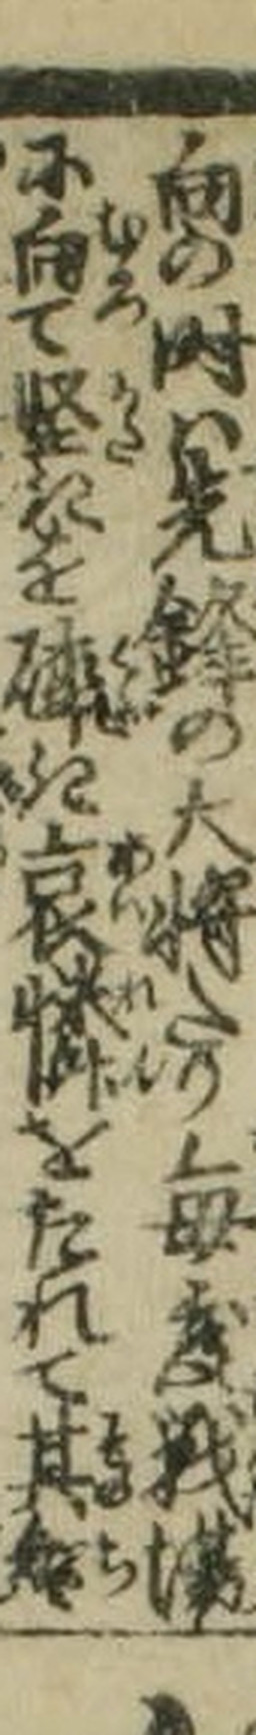に向て堅きを砕き哀憐をたれて其智
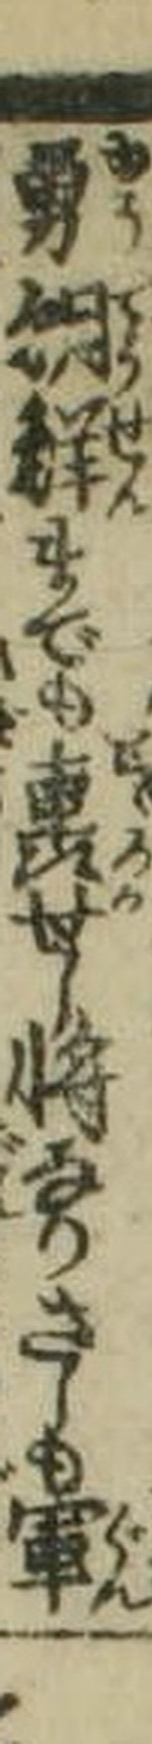勇朝鮮までも轟せし将なりさしも軍
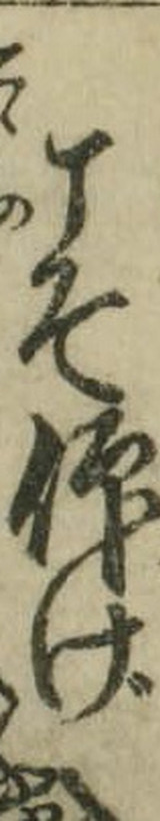こそ仰げ
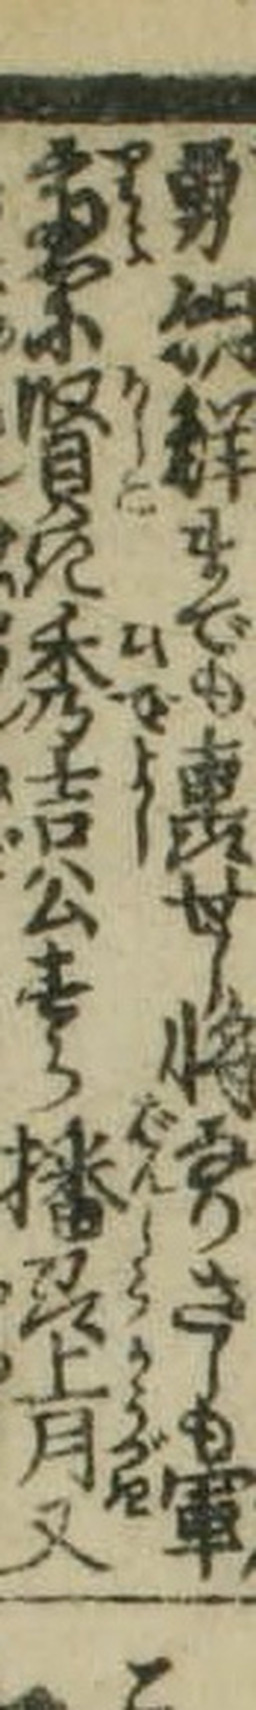慮に賢き秀吉公すら播州上月又
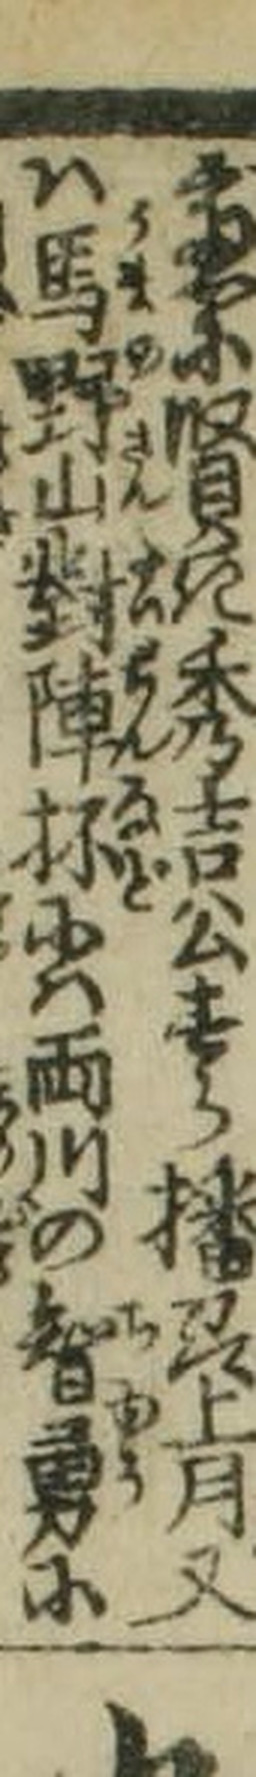は馬野山対陣抔には両川の智勇に
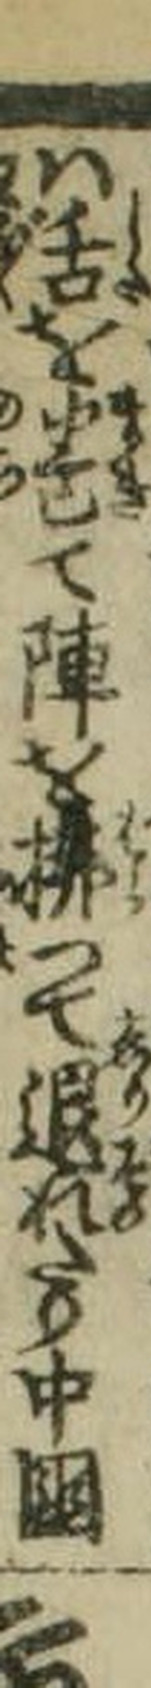は舌を巻て陣を払つて退れたり中国
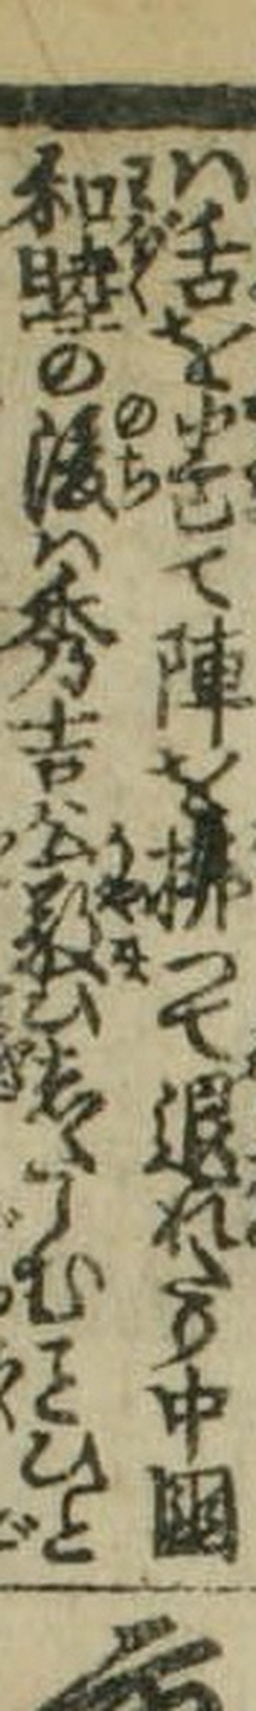和睦の後は秀吉公敬ひしたしむことひと
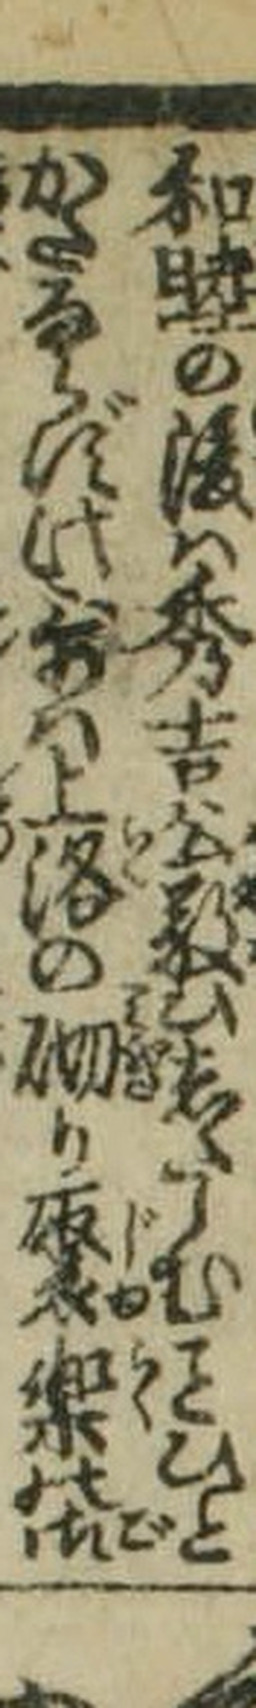かたならず此哥は上洛の砌り聚楽の御
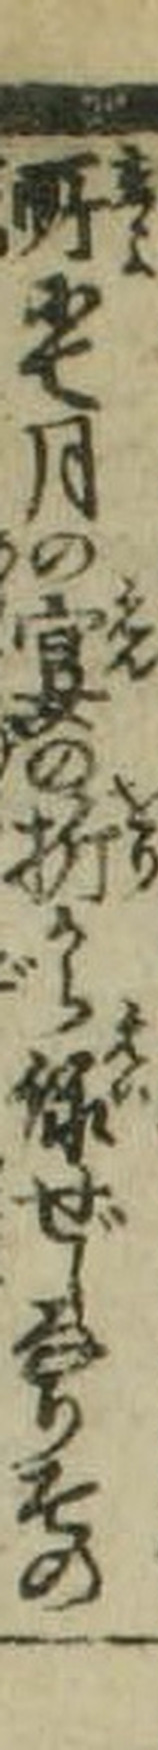所にて月の宴の折から詠ぜしなりその
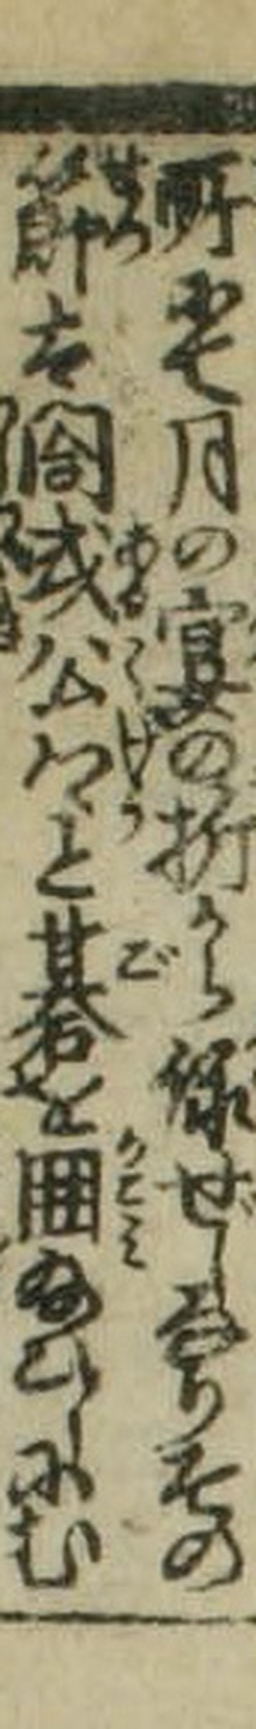節太閤或公卿と碁を囲給ひしにむ
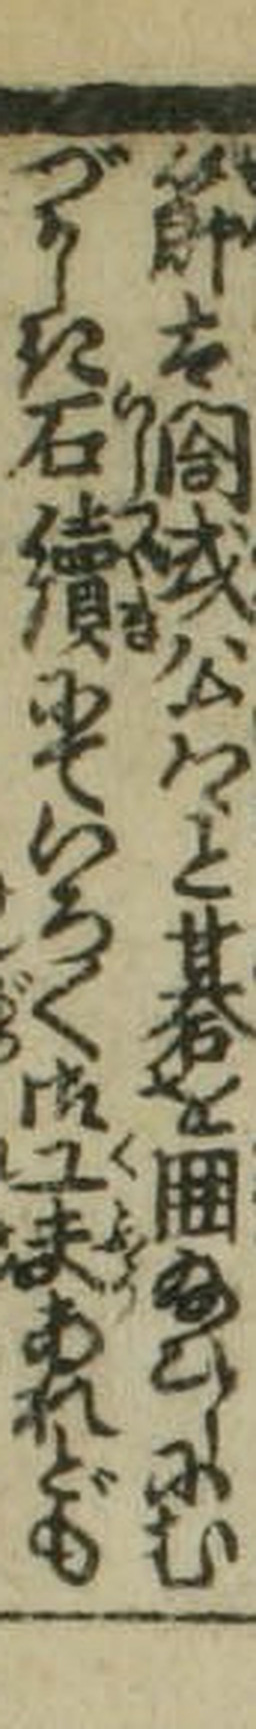づかしき石続にていろ〳〵御工夫あれども
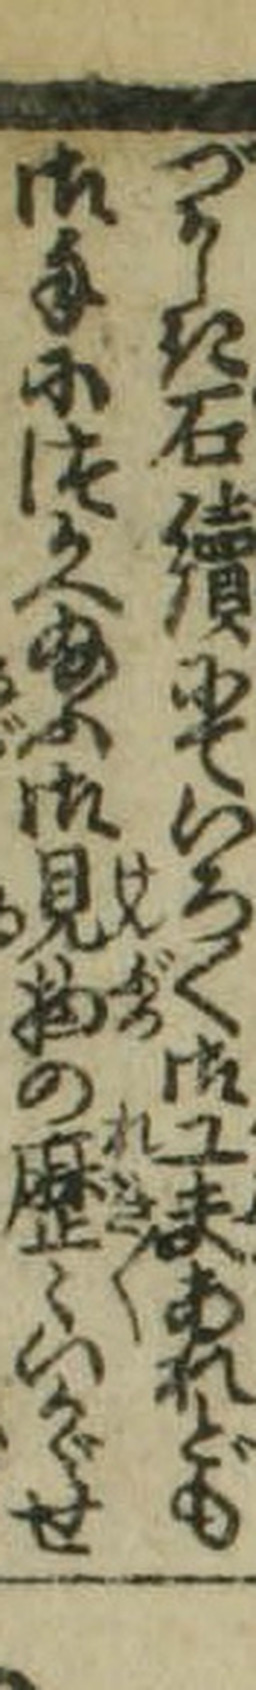御手につかへ給ふ御見物の歴々いかがせ
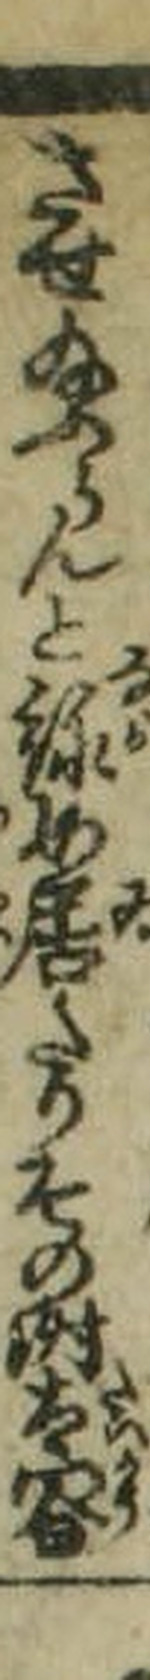させ給ふらんと詠め居たりその時太閤
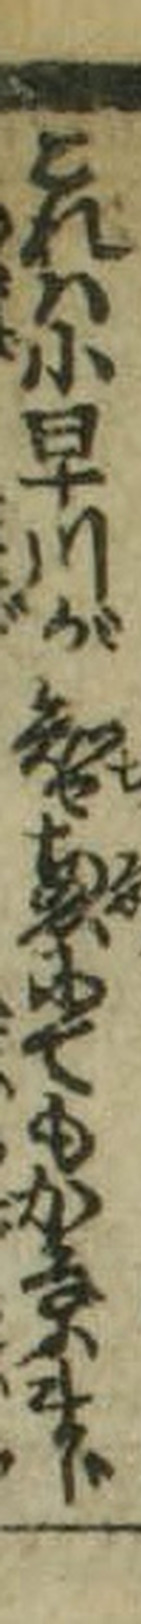これは小早川が智恵にてもかなふまじ
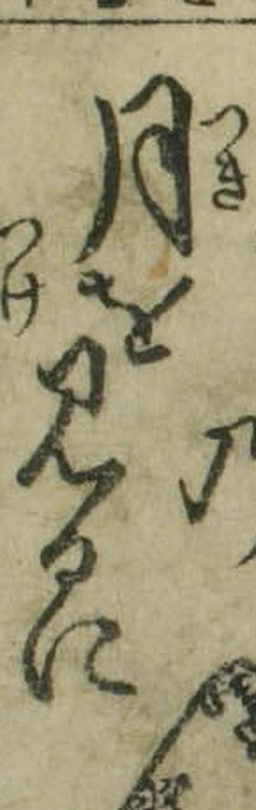月を見るに
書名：續英雄百人一首
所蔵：東京学芸大学附属図書館
